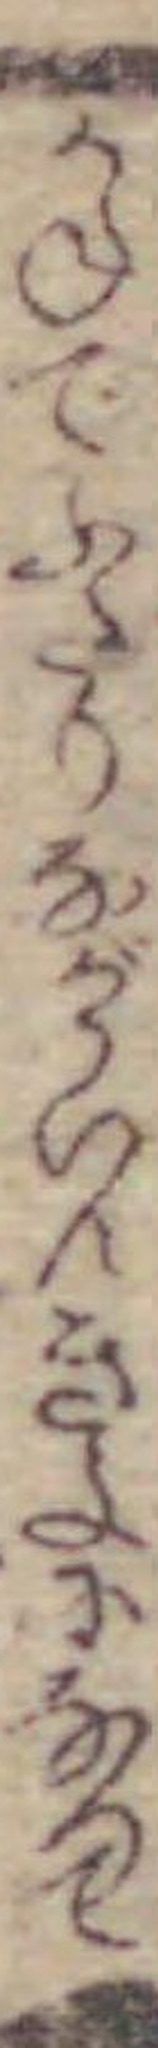かねてふたりながらいんきよになつて
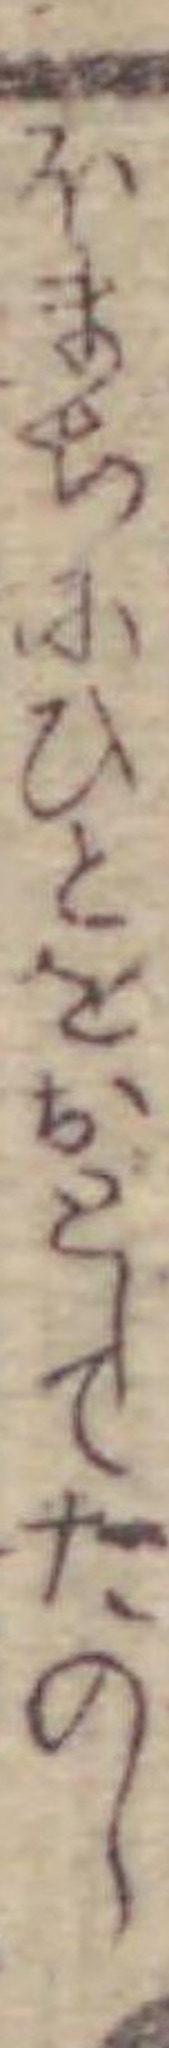ほまちにひとをおとしてたのし
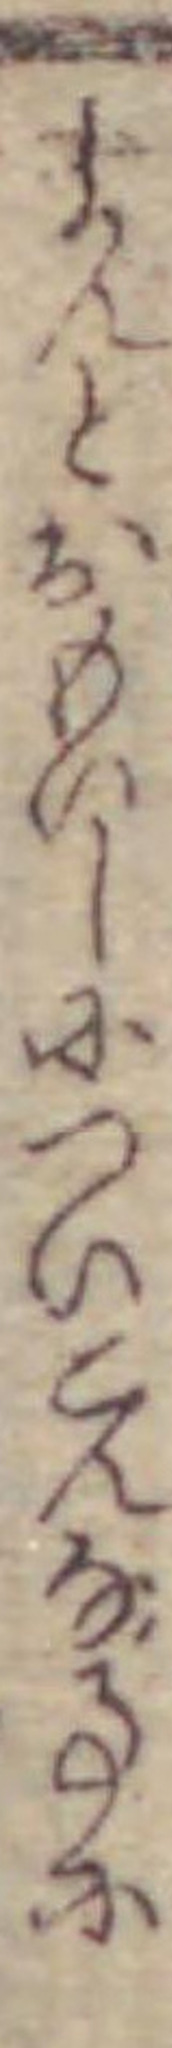まんとおもいしについこんな事に
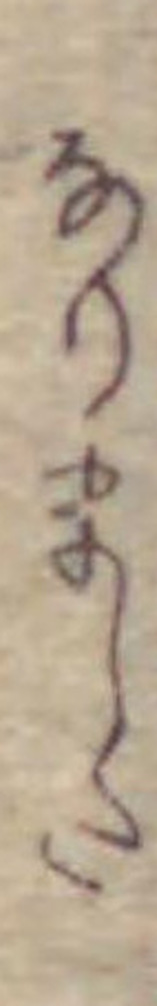なりました
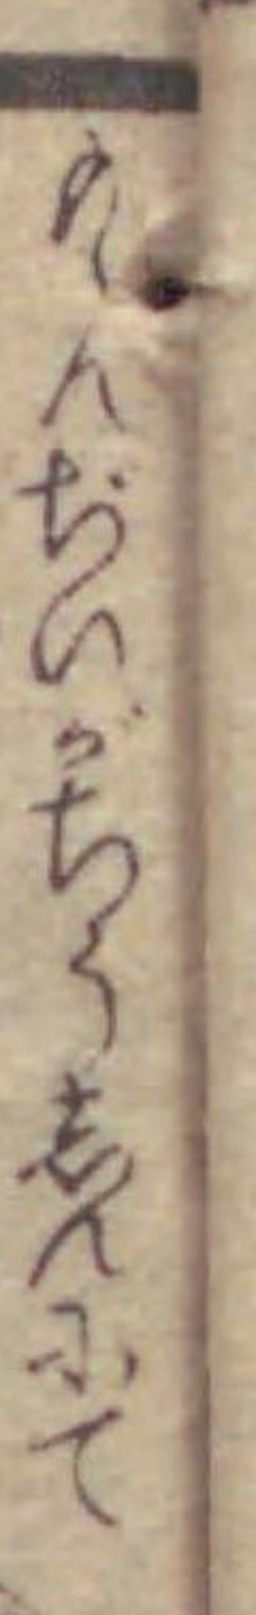もゝんぢいがちうしんにて
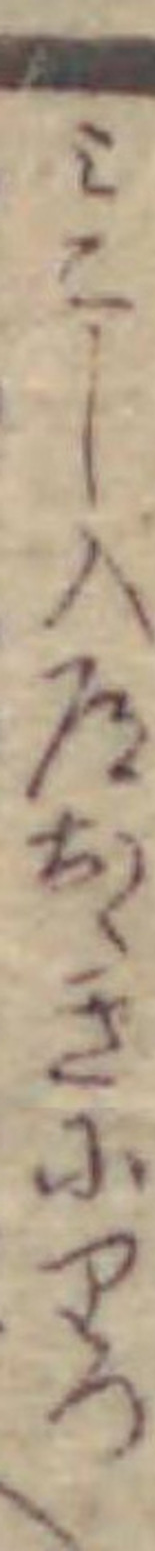みこし入道おゝきにりつ
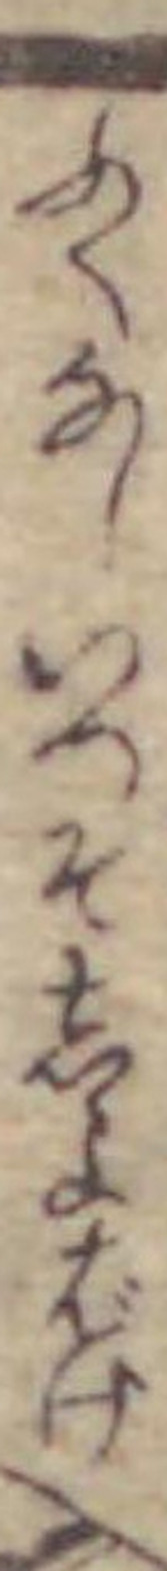ふくなしいつそしよばけ
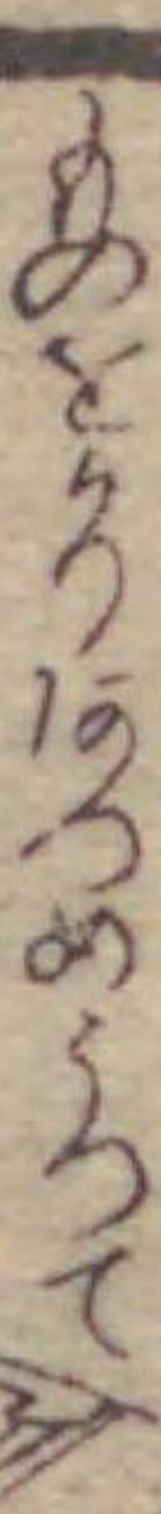ものをかりあつめうつて
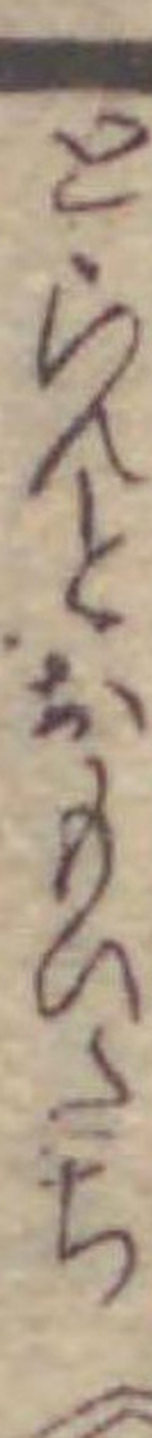とらんとおもひたち
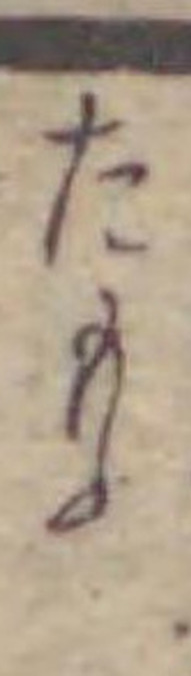たもふ
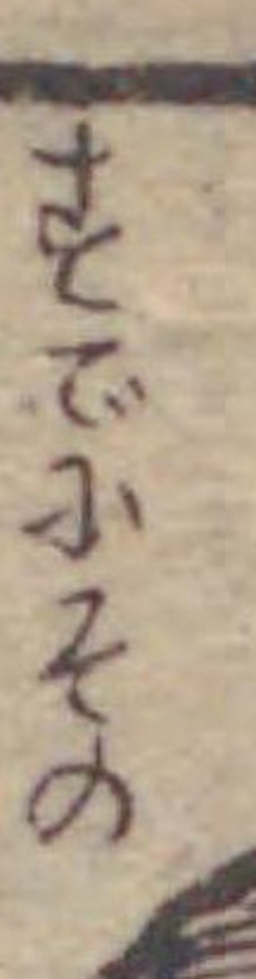すでにその
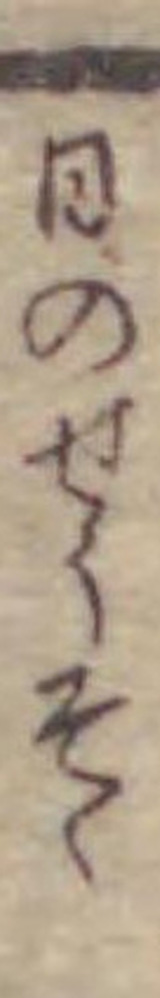日のせうそく
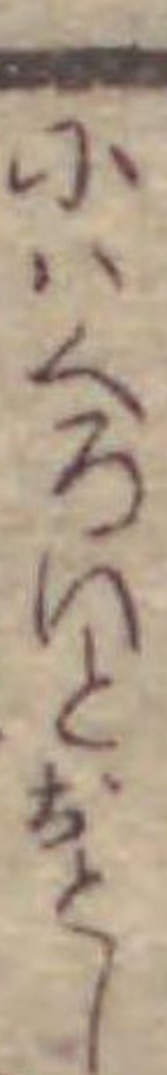にはくろいとおとし
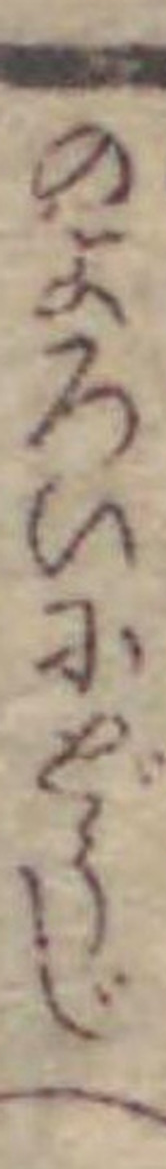のよろいにどうじ
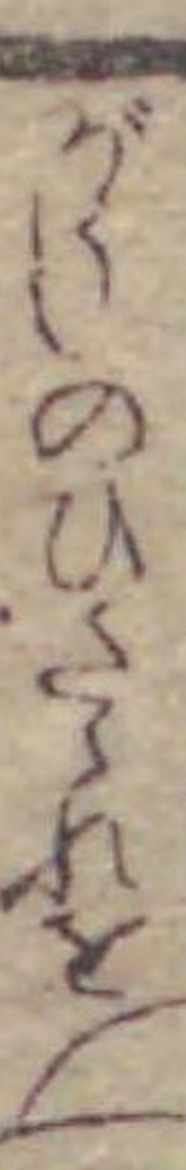がうしのひたゝれを
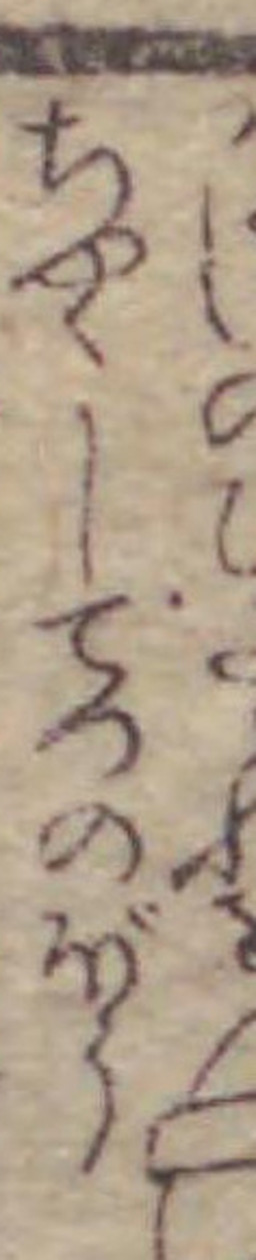ちやくしてつのぼう
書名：化物仲間破 : 2巻
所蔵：国立国会図書館 National Diet Library, JAPAN
